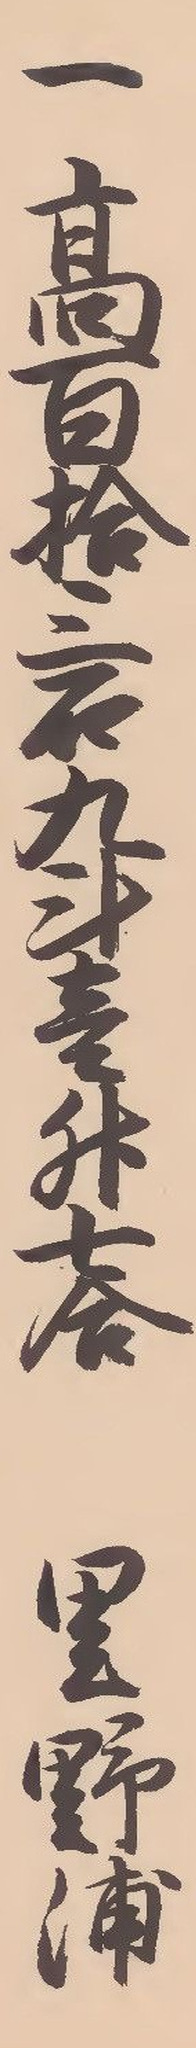一高百拾三石九斗壱升七合里野浦

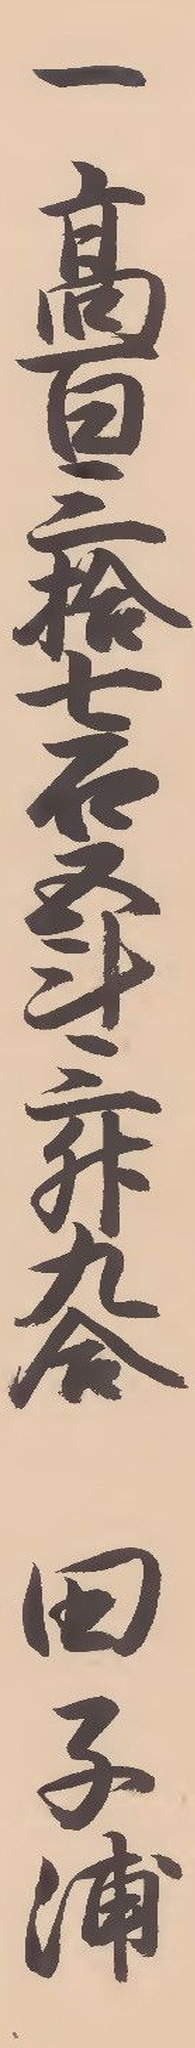一高百三拾七石五斗三升九合田子浦
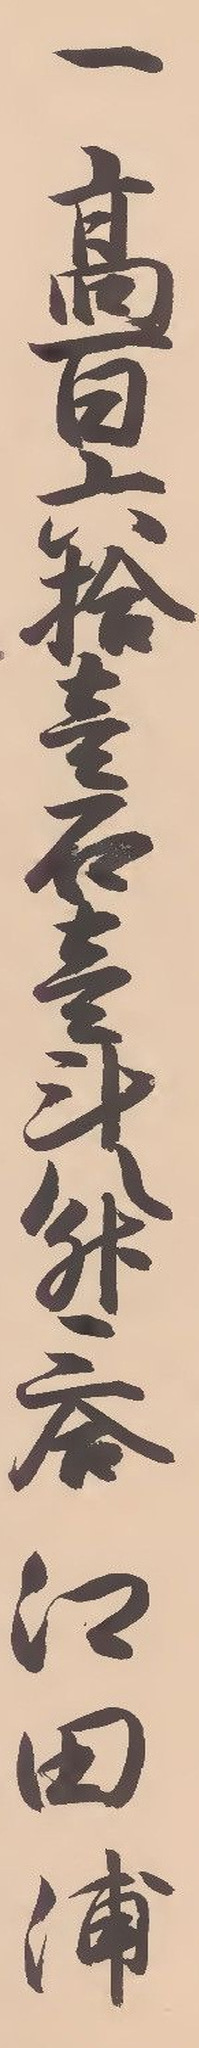一高百六拾壱石壱斗八升三合江田浦
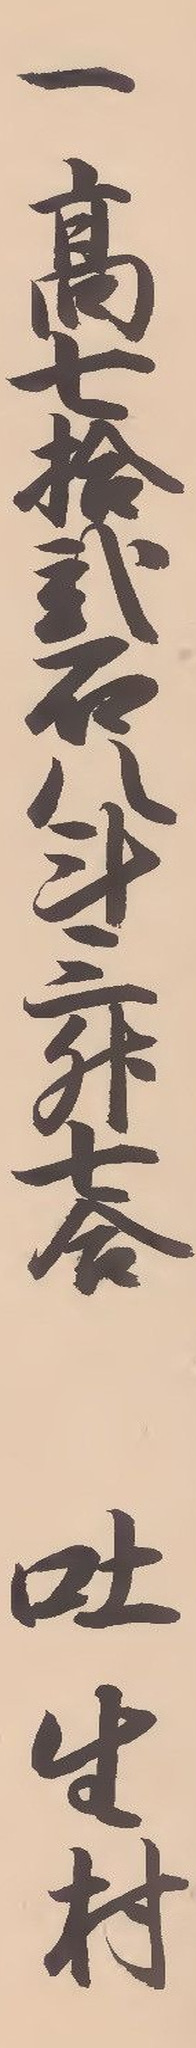一高七拾弐石八斗三升七合吐生村
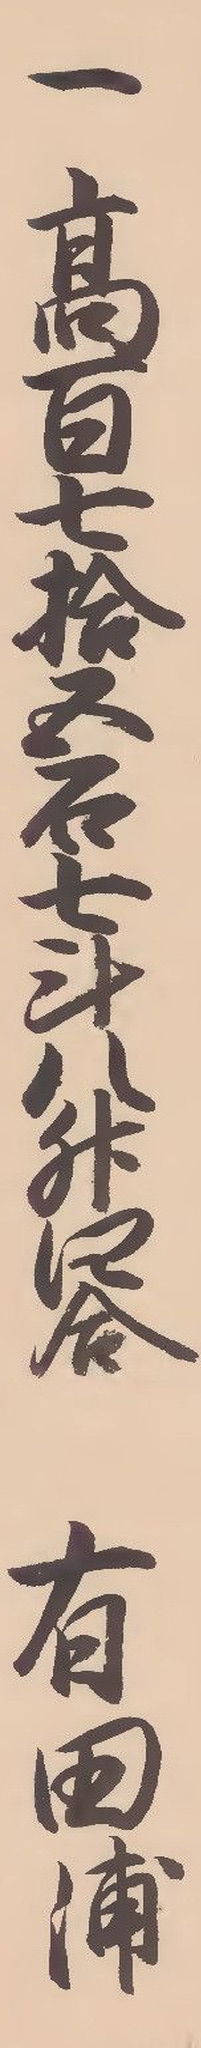一高百七拾五石七斗八升四合有田浦
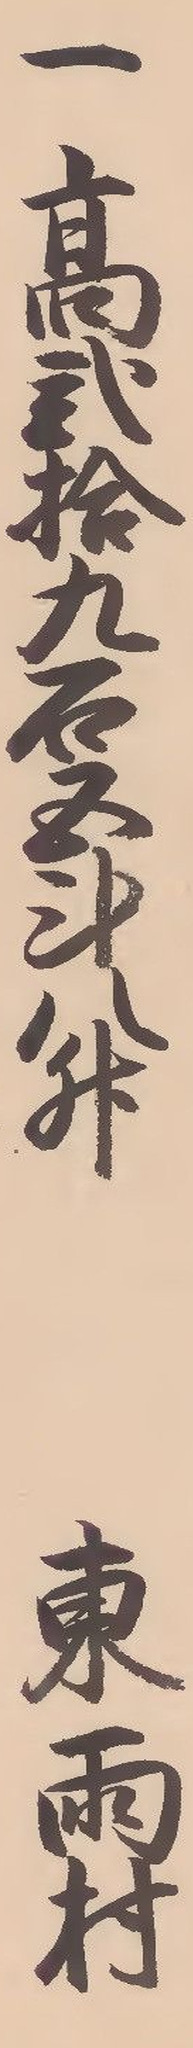一高弐拾九石五斗八升東雨村

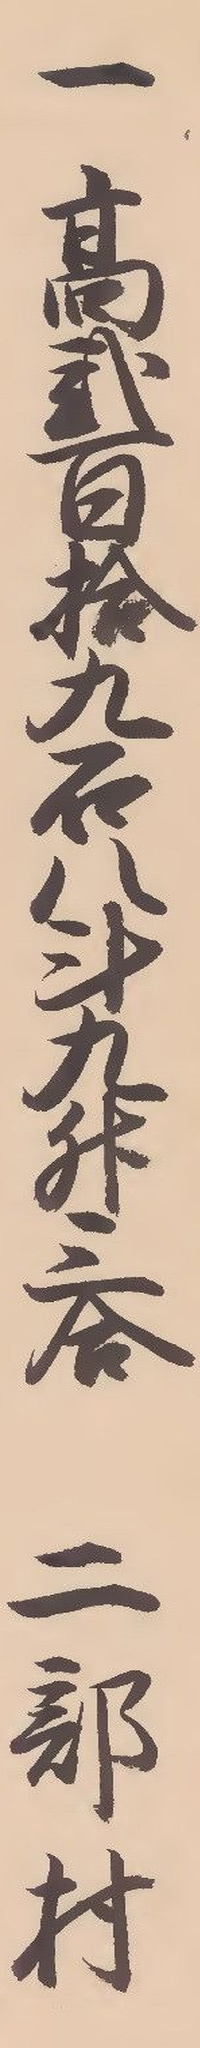一高弐百拾九石八斗九升三合二部村
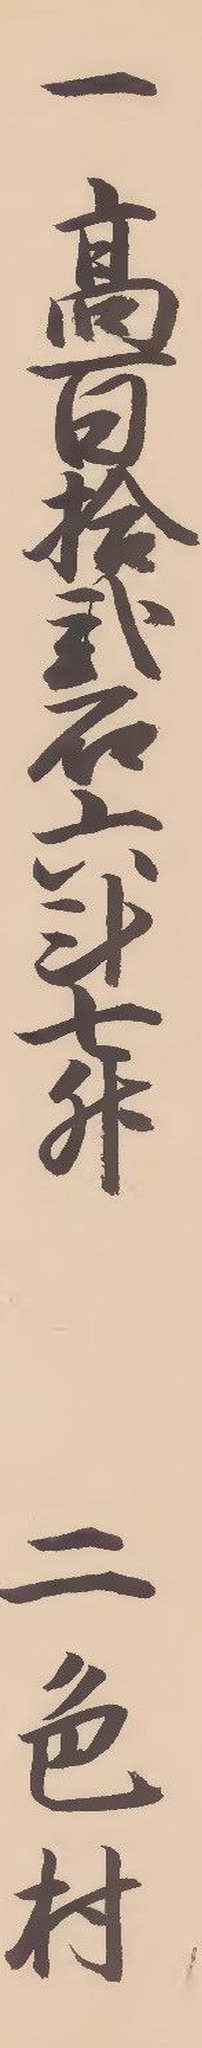一高百拾弐石六斗七升二色村
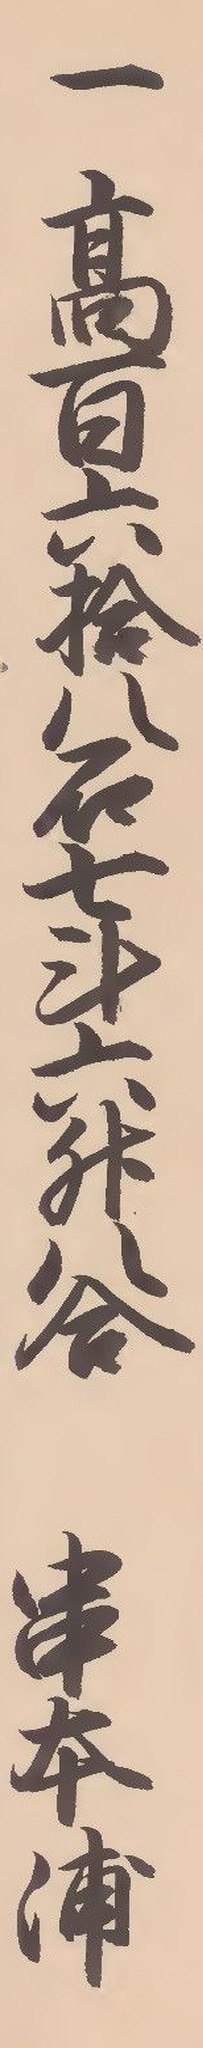一高百六拾八石七斗六升八合串本浦
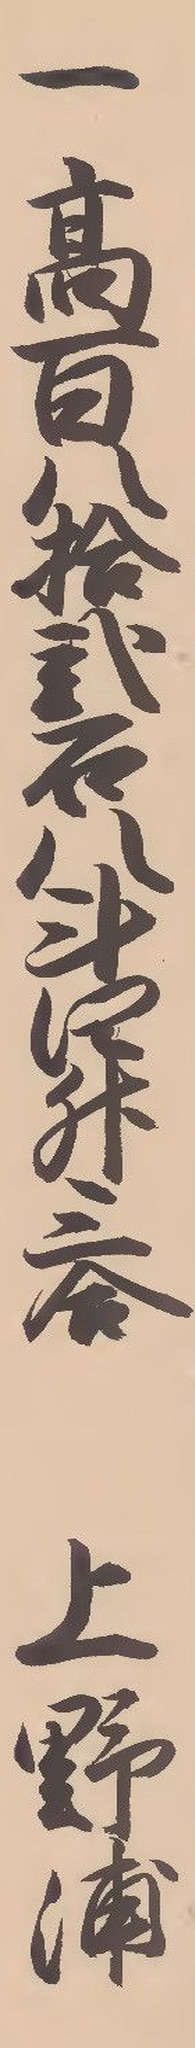一高百八拾弐石八斗四升三合上野浦
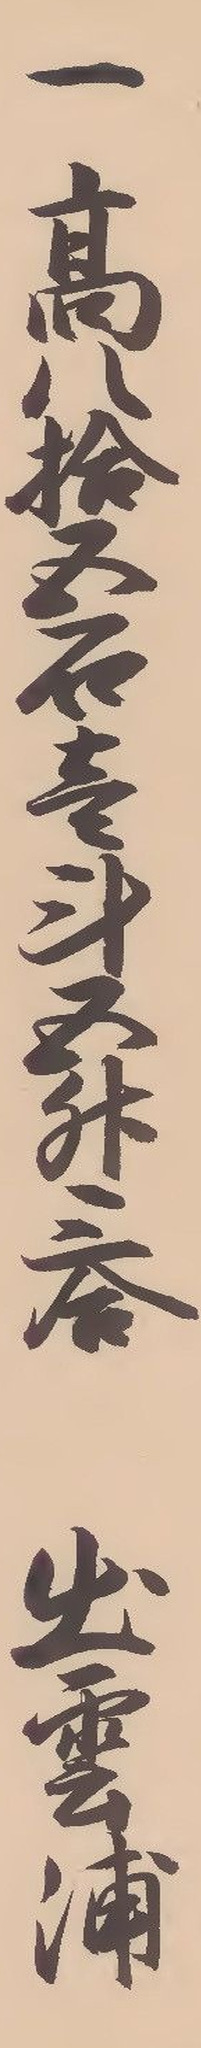一高八拾五石壱斗五升三合出雲浦
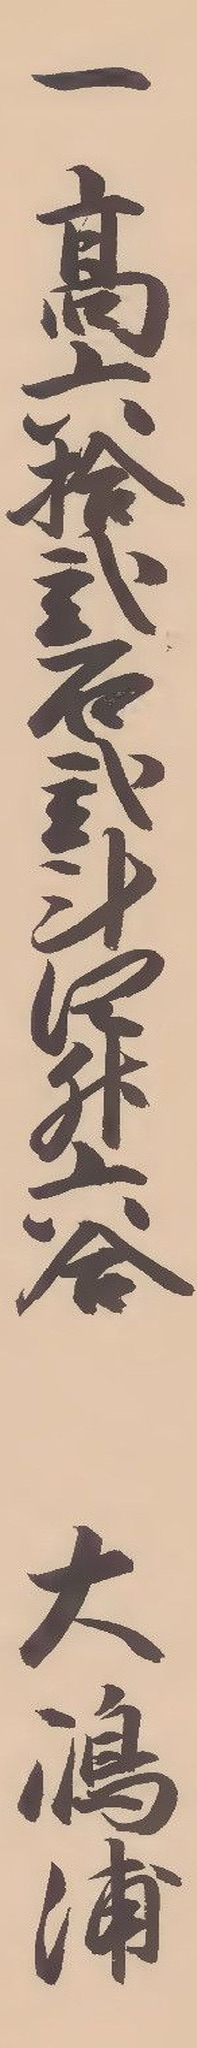一高六拾弐石弐斗四升六合大島浦
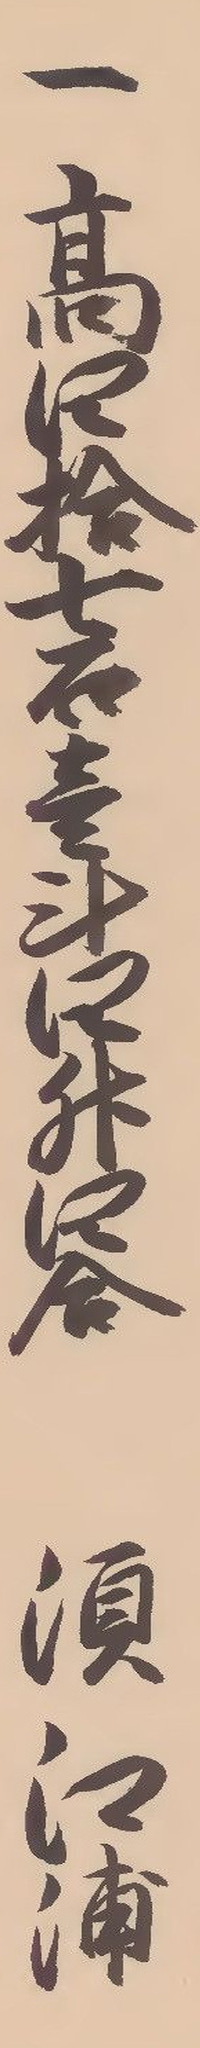一高四拾七石壱斗四升四合須江浦

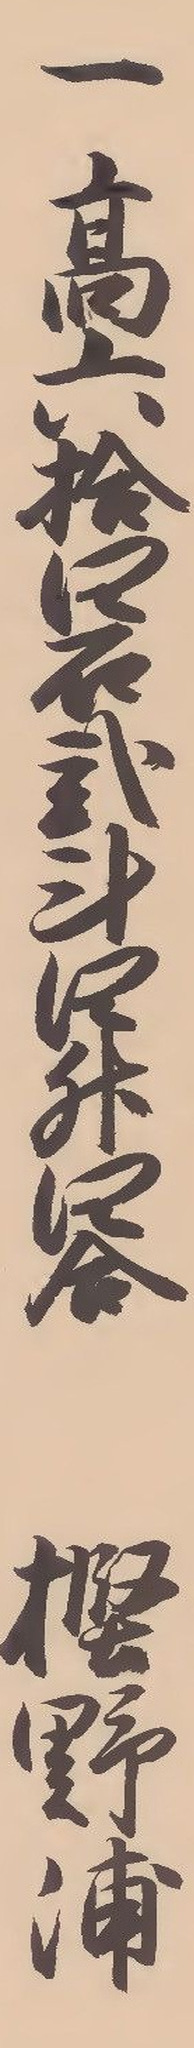一高六拾四石弐斗四升四合樫野浦
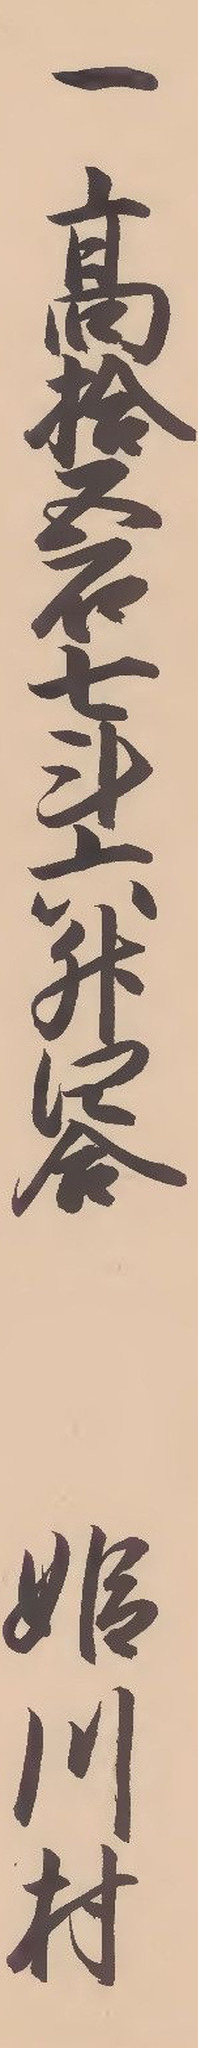一高拾五石七斗六升四合姫川村
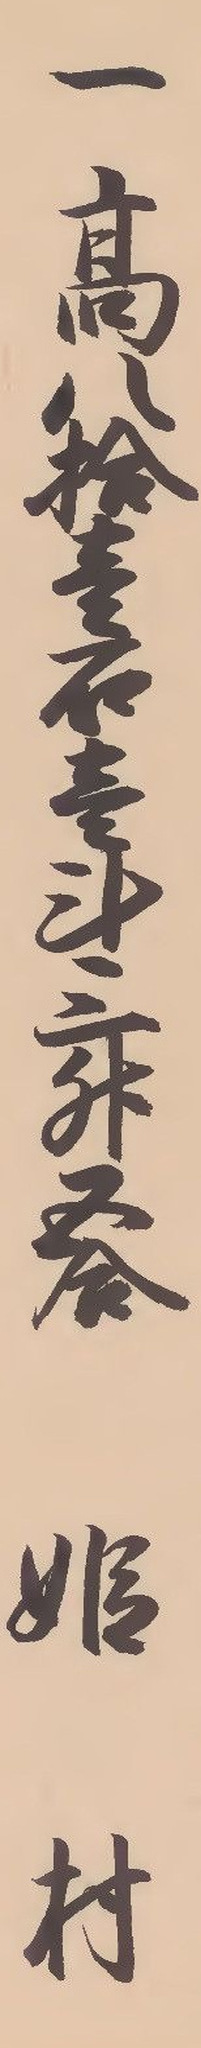一高八拾壱石壱斗三升五合姫村
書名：紀伊国郷帳
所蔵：国立公文書館 National Archives of Japan
